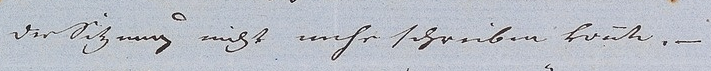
der Sitzung nicht mehr schreiben konnte. –
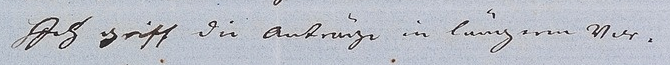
Ich griff die Anträge in längerm Vor-
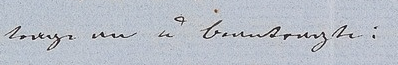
trage an u beantragte:
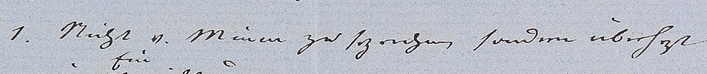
1. Nicht v. Minen zu sprechen, sondern überhpt
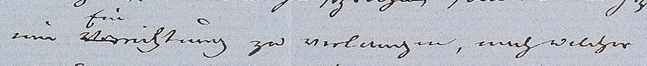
eine VerEinrichtung zu verlangen, nach welcher
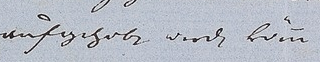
aufgehoben werden könne.
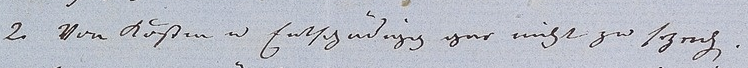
2. Von Kosten u Entschädigg gar nicht zu sprechen.
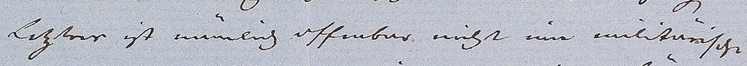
Letztres ist nämlich offenbar nicht eine militärische
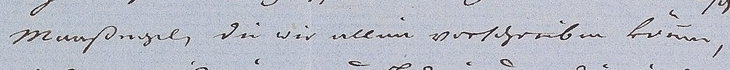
Maaßregel, die wir allein vorschreiben können,
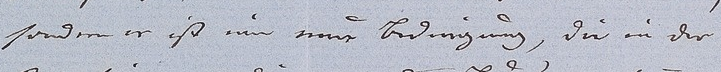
sondern es ist eine neue Bedingung, die in der
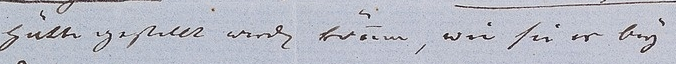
hätte gestellt werden können, wie sie es bey
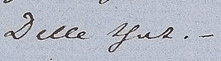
Delle that. –
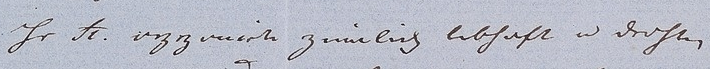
Hr St. opponirte ziemlich lebhaft u drohte,
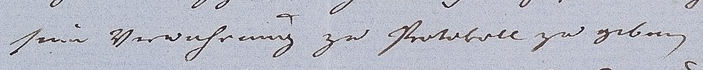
seine Verwahrung zu Protokoll zu geben,
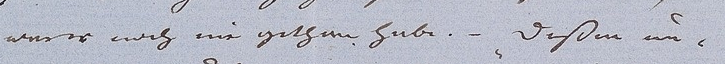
was er noch nie gethan habe. – Deßen un-
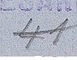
gegen
